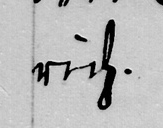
sich
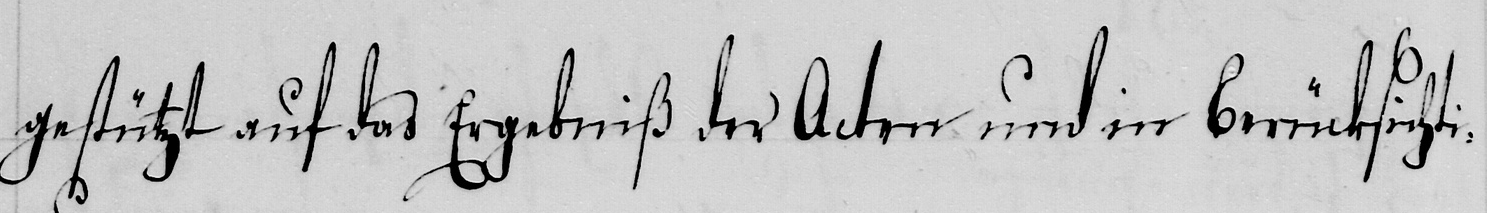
gestützt auf das Ergebniß der Acten und in Berücksicht¬
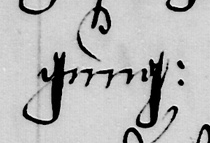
gung
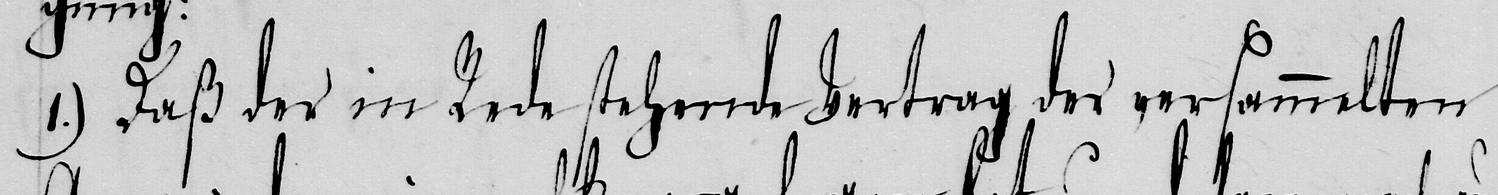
1.) Daß der in Rede stehende Vertrag der versammelten
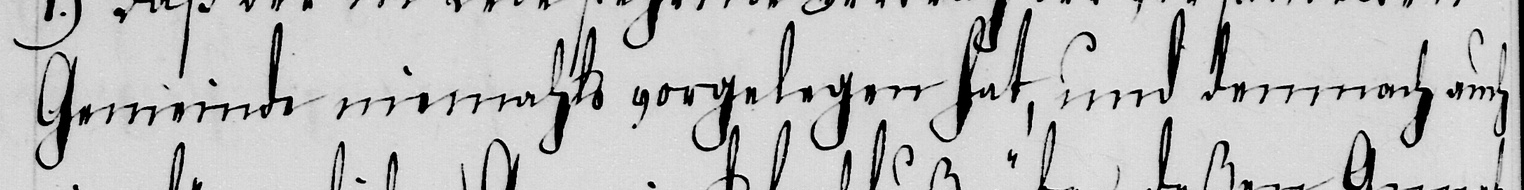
Gemeinde niemahls vorgelegen hat, und demnach au¬
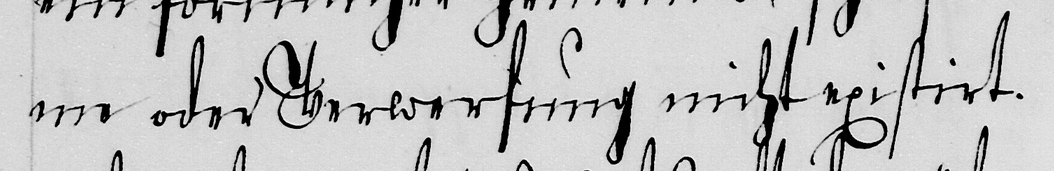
me oder Verwerfung nicht existirt.
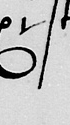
des
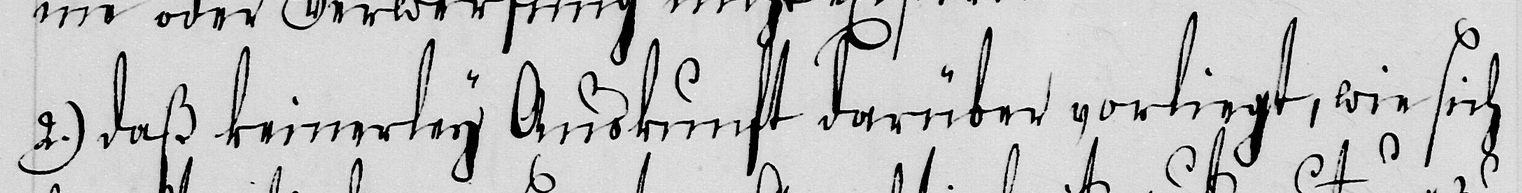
2.) daß keinerley Auskunft darüber vorliegt, wie sich
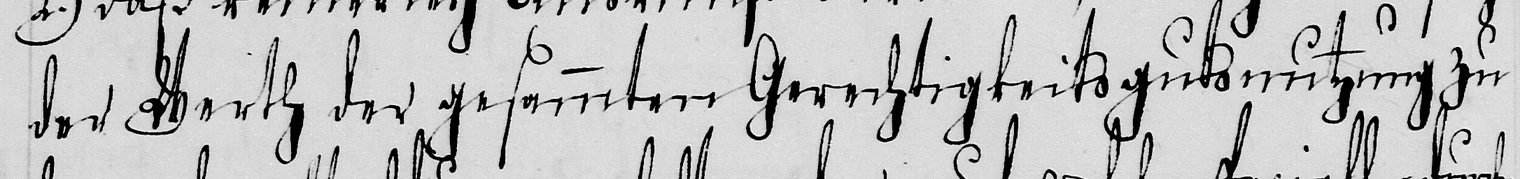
der Werth der gesammten Gerechtigkeitsgutsnutzung zu
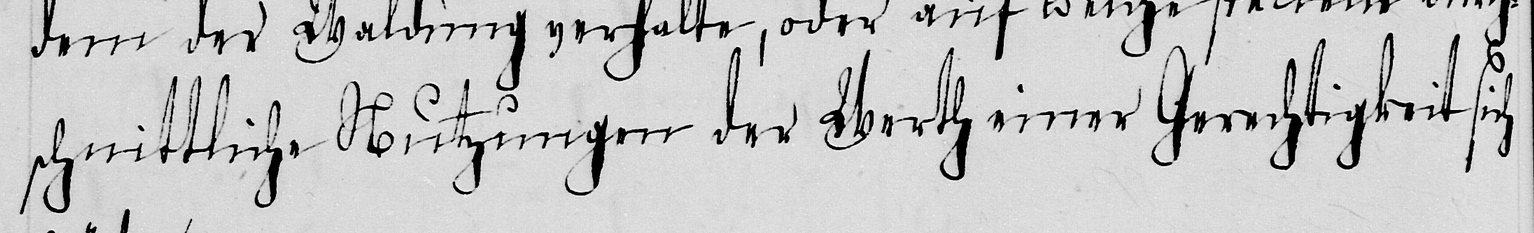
schnittliche Nutzungen der Werth einer Gerechtigkeit si¬
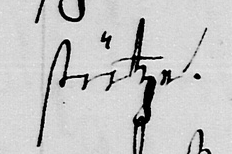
stütze.
